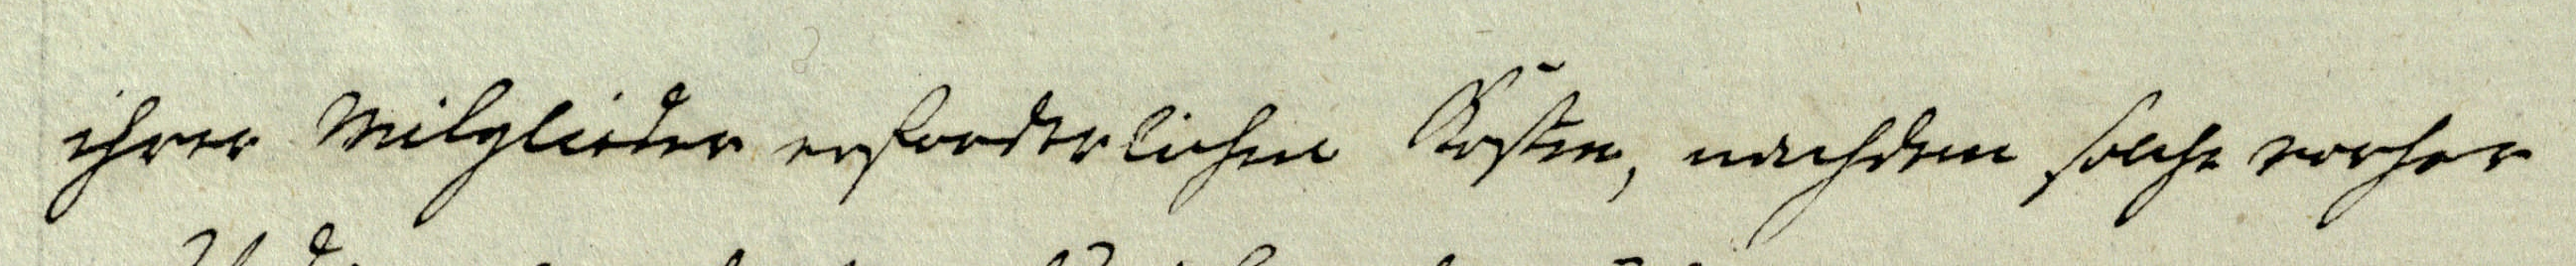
ihrer Mitglieder erforderlichen Kosten, nachdem solche vorher
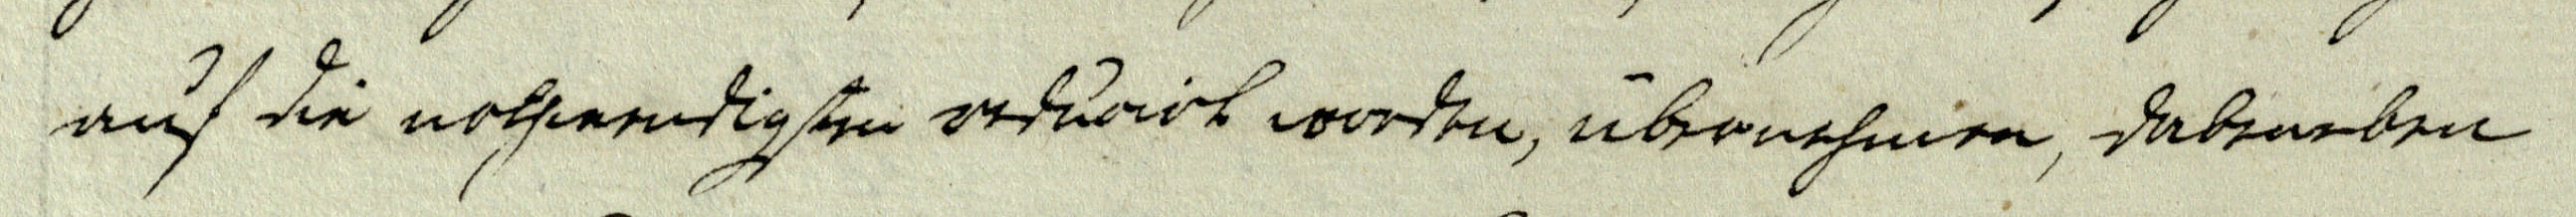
auf die nothwendigsten reducirt worden, übernehmen, dabeneben
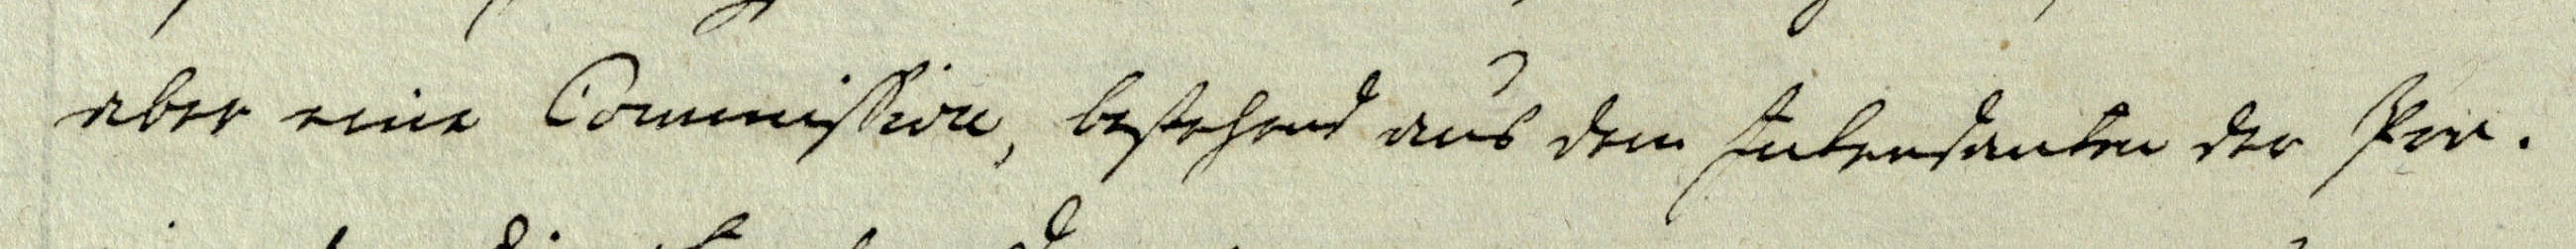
aber eine Commission, bestehend aus dem Intendanten der Pro¬
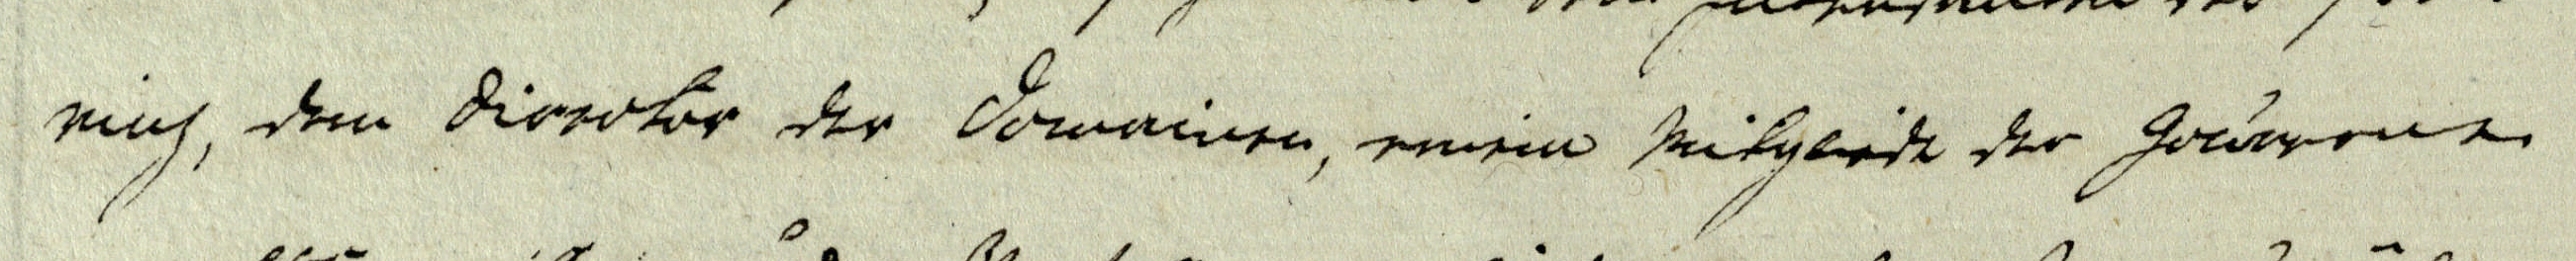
vinz, dem Director der Domainen, einem Mitgliede der Gouverne¬
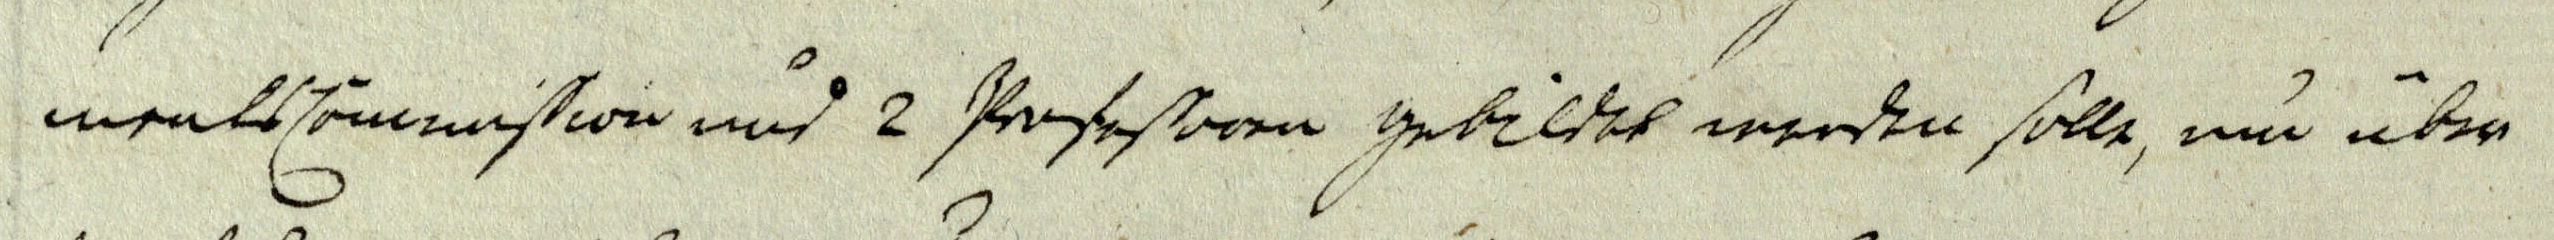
mentsCommission und 2 Professoren gebildet werden solle, um über
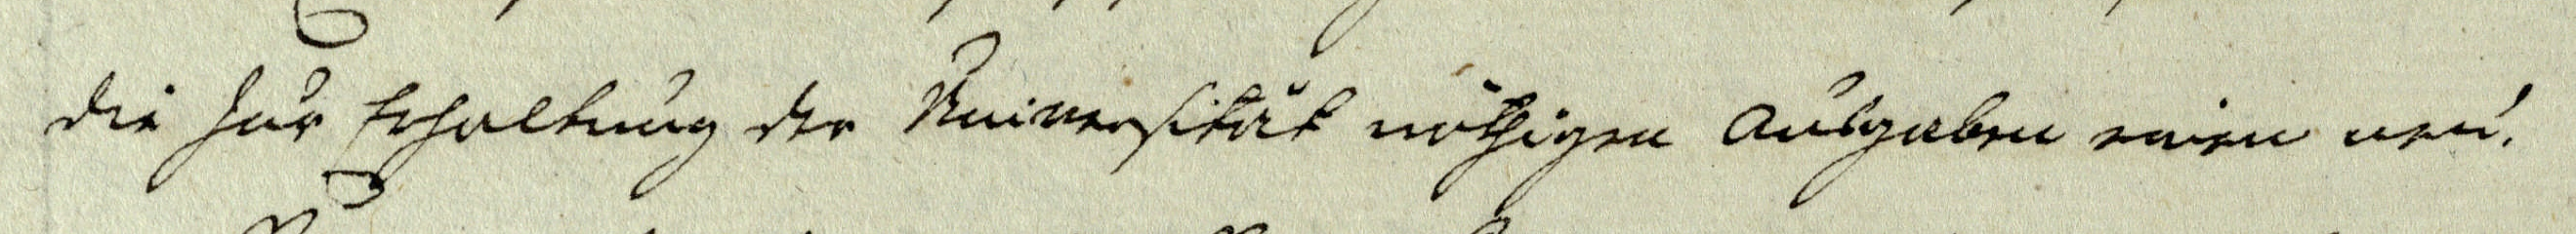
die zur Erhaltung der Universität nöthigen Ausgaben einen neu¬
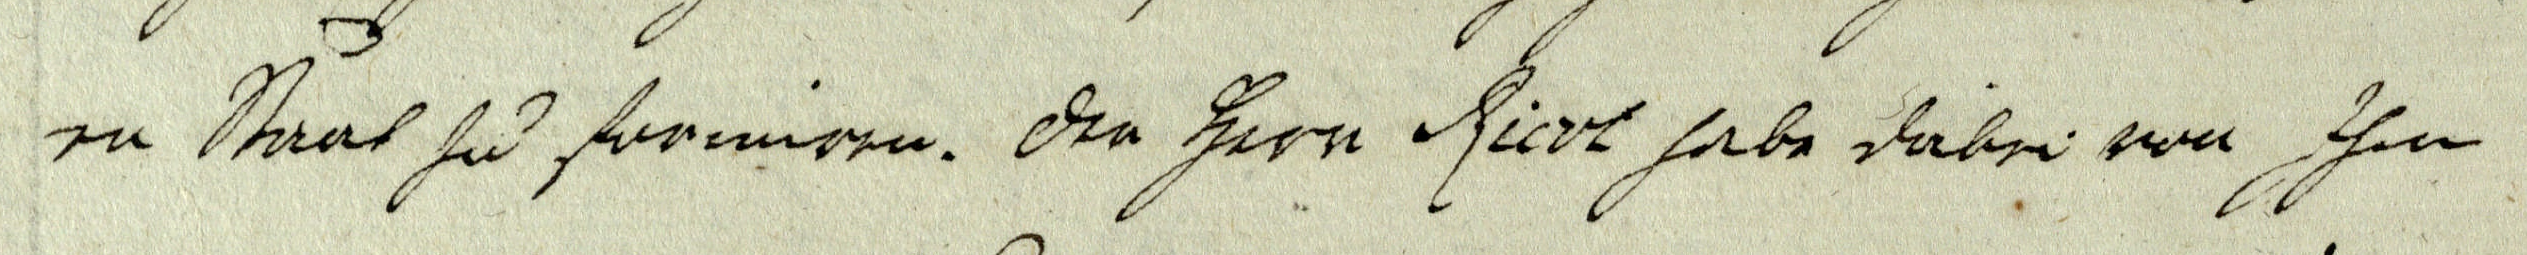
en Staat zu formiren. Der Herr Ricot habe dabei von Ihm
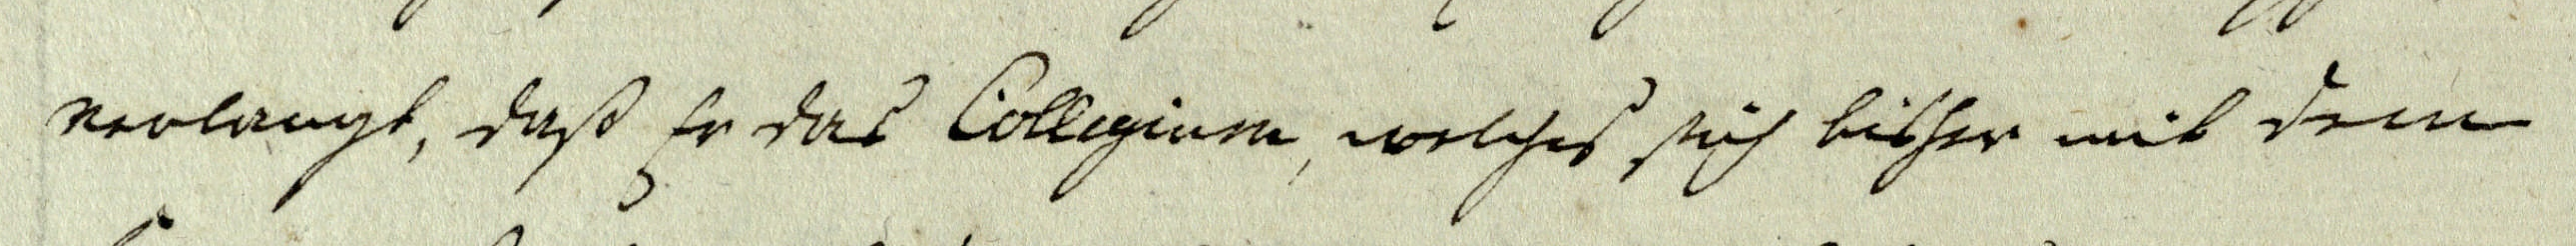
verlangt, daß Er das Collegium, welches sich bisher mit dem
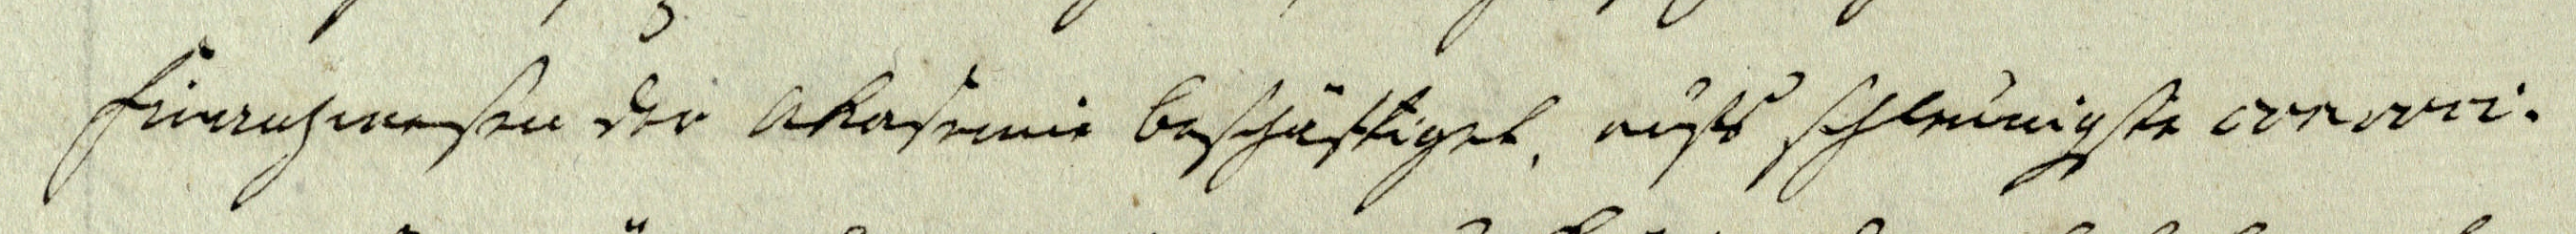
Finanzwesen der Akademie beschäftiget, aufs schleunigste convoci¬
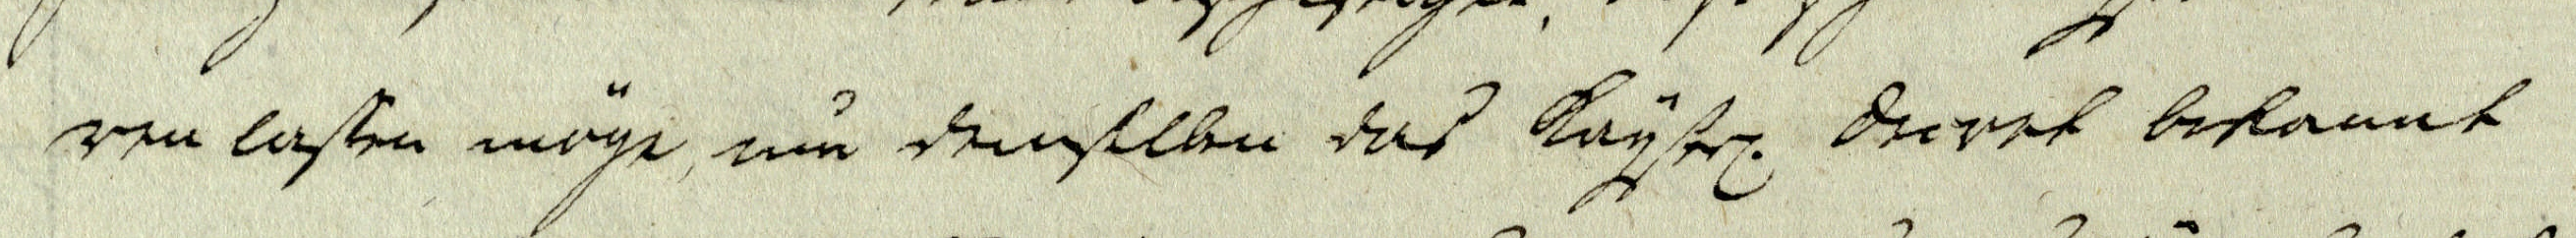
ren lassen möge, um demselben das Kaÿser. Decret bekannt
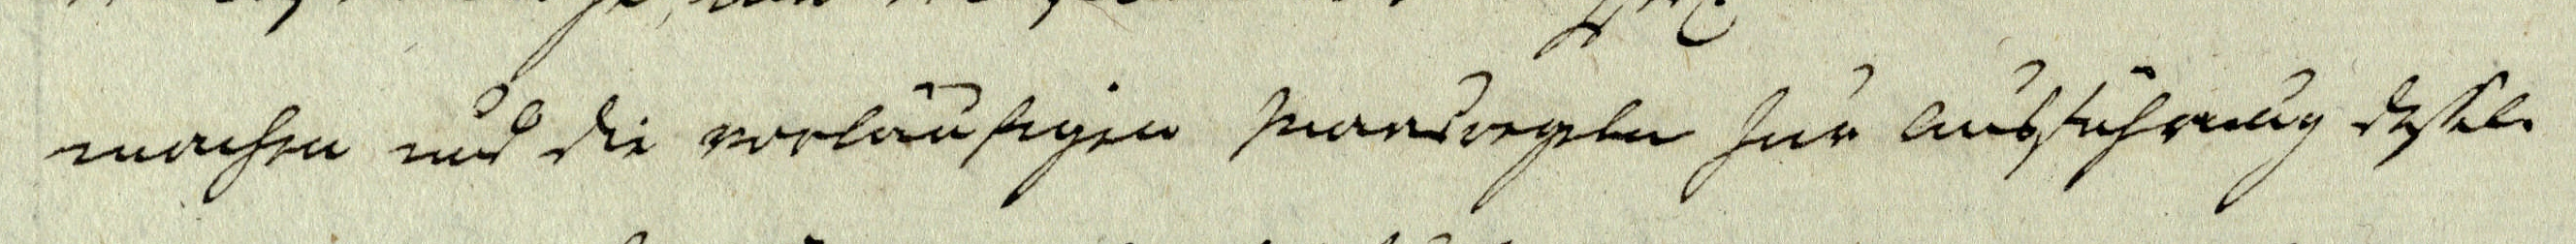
machen und die vorläufigen Maasregeln zur Ausführung dessel¬
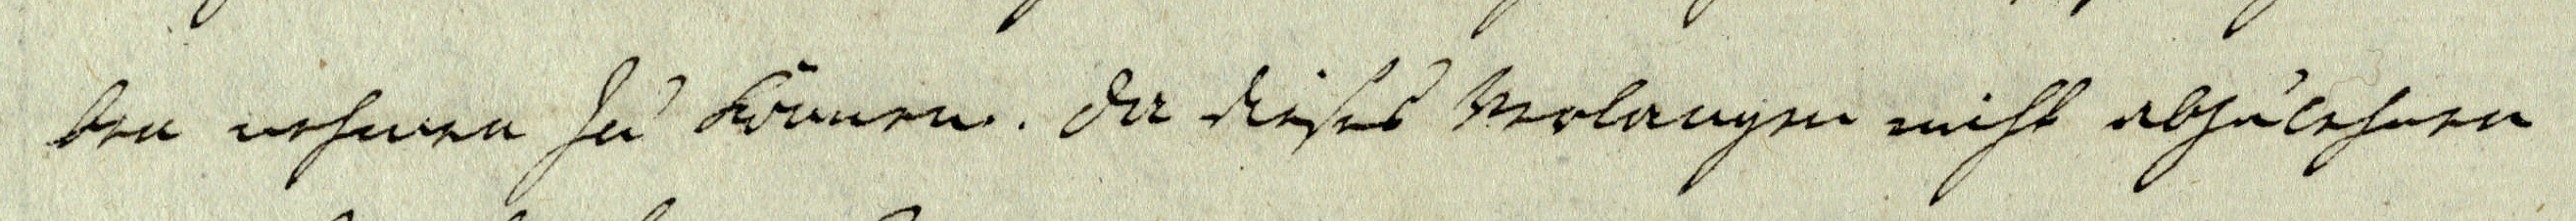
ben nehmen zu können. Da dieses Verlangen nicht abzulehnen
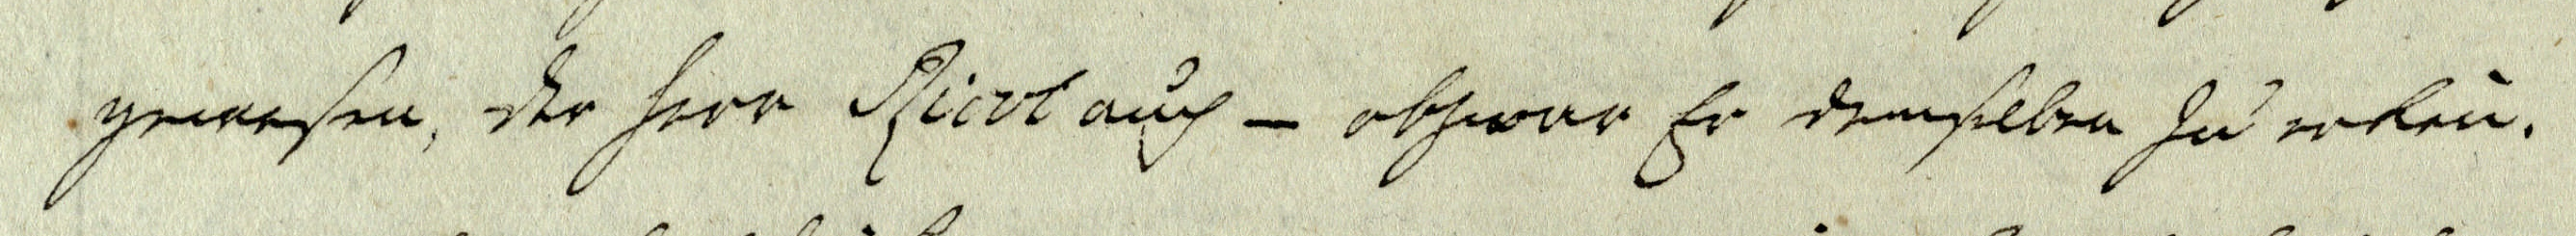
gewesen, der Herr Ricot auch obzwar Er demselben zu erken¬
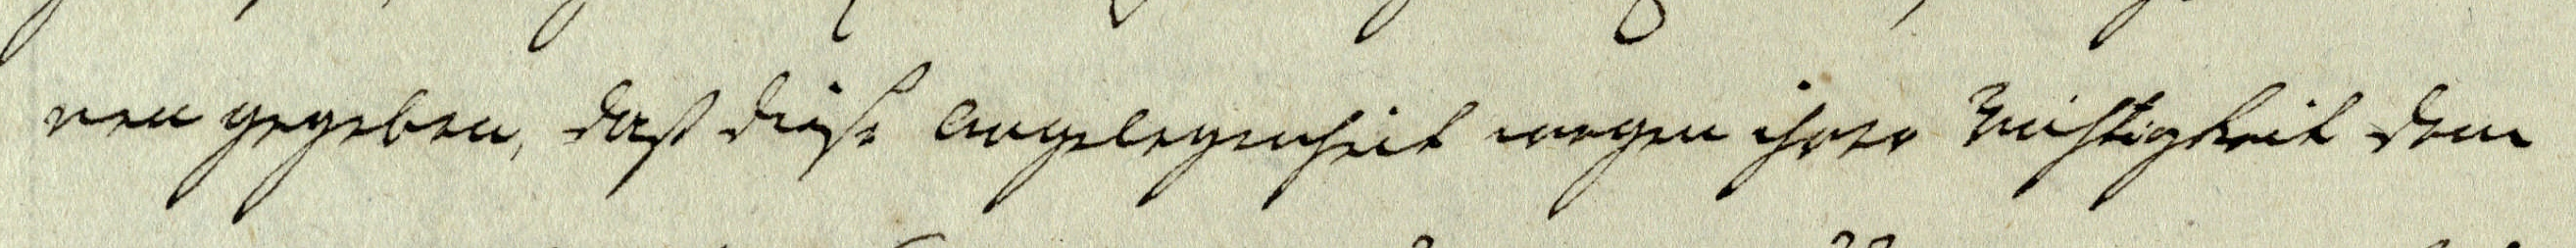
nen gegeben, daß diese Angelegenheit wegen ihrer Wichtigkeit dem
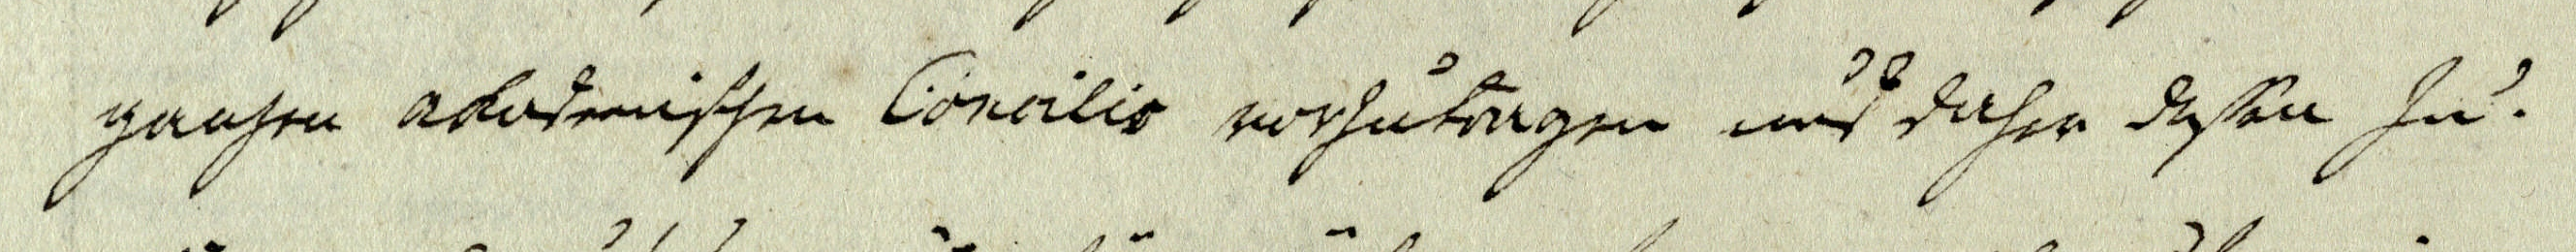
ganzen Akademischen Concilio vorzutragen und daher dessen Zu¬
